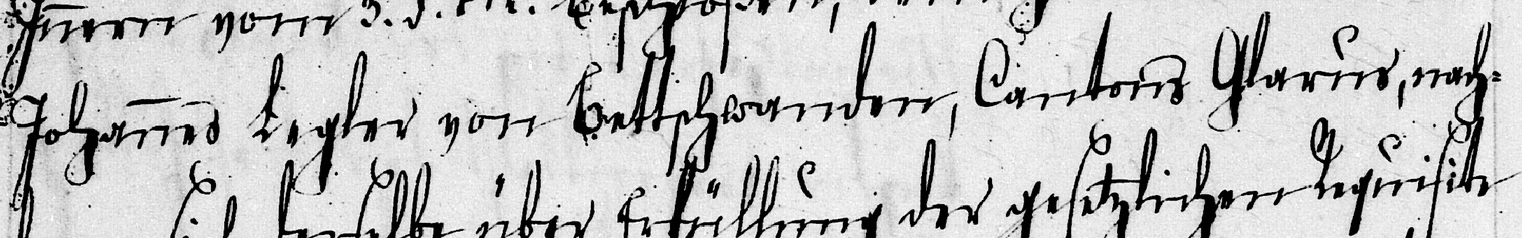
Johannes Legler von Bettschwanden, Cantons Glarus, nach¬
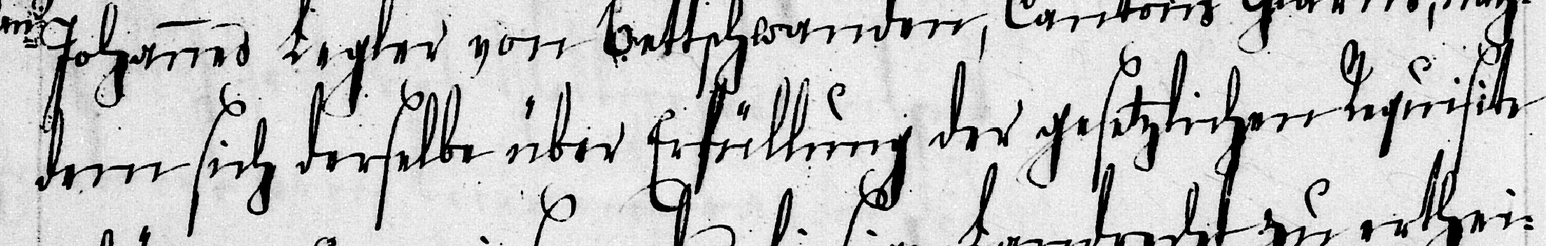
dem sich derselbe über Erfüllung der gesetzlichen Requisite
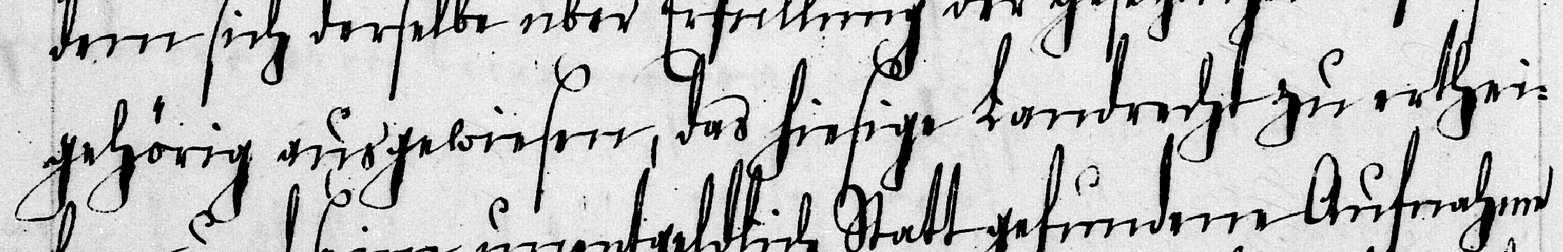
gehörig ausgewiesen, das hiesige Landrecht zu erthei¬
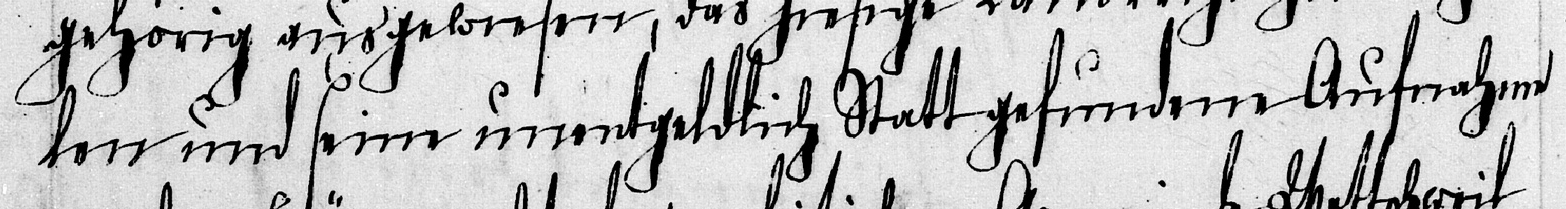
len und seine unentgeldlich Statt gefundene Aufnahme
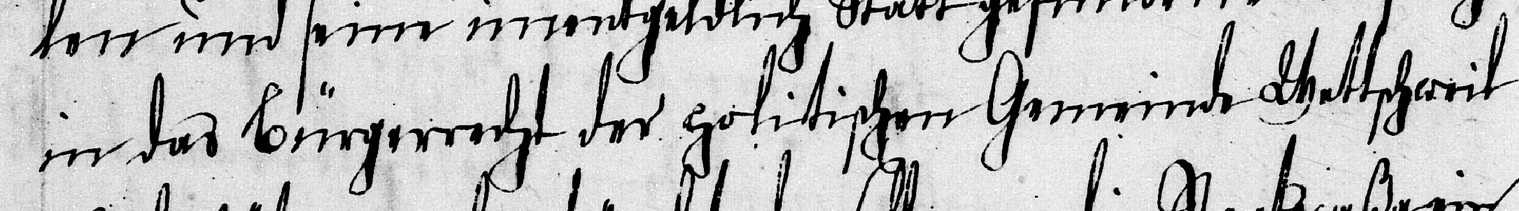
in das Bürgerrecht der politischen Gemeinde Wettschweil
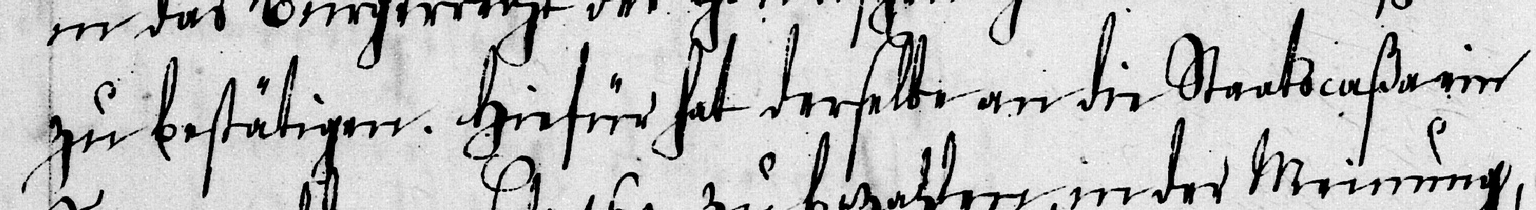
zu bestätigen. Hiefür hat derselbe an die Staatscaßa ein
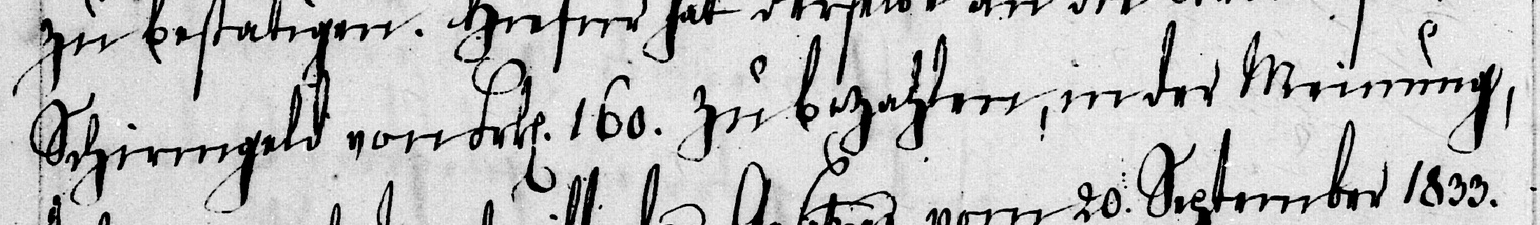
Schirmgeld von Frk[en]. 160. zu bezahlen, in der Meinung,
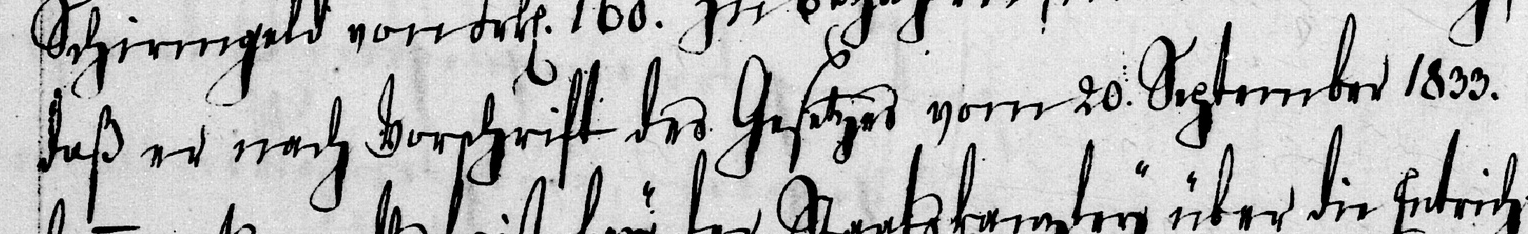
daß er nach Vorschrift des Gesetzes vom 20. September 1833.
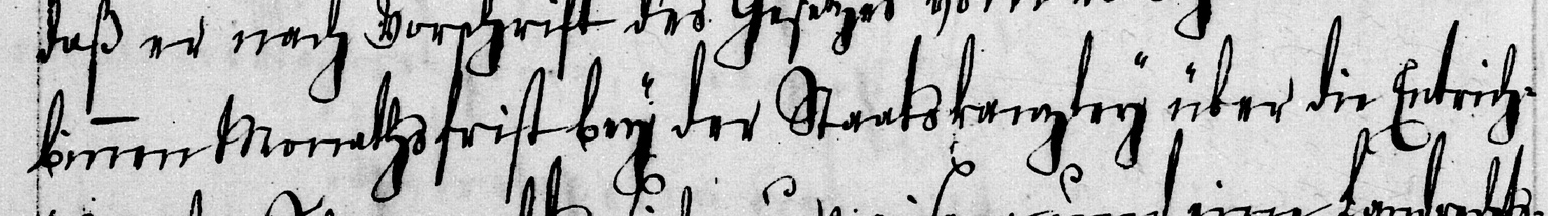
binnen Monathsfrist bey der Staatskanzley über die Entrich¬
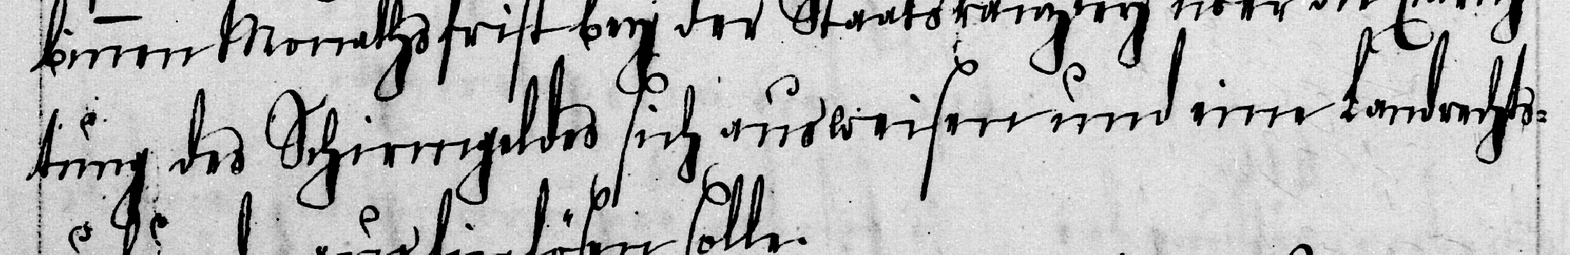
tung des Schirmgeldes sich ausweisen und eine Landrecht¬
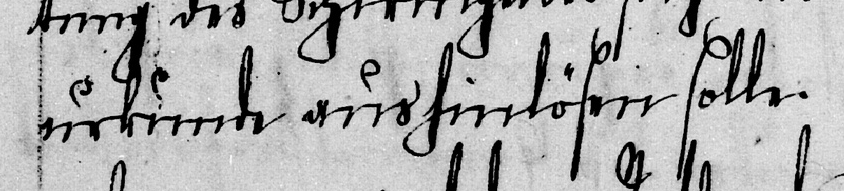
surkunde aushinlösen soll¬
